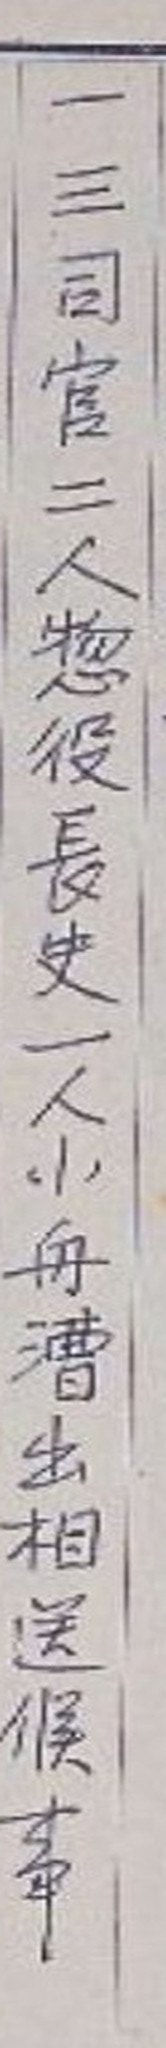一三司官二人惣役長史一人小舟漕出相送候事
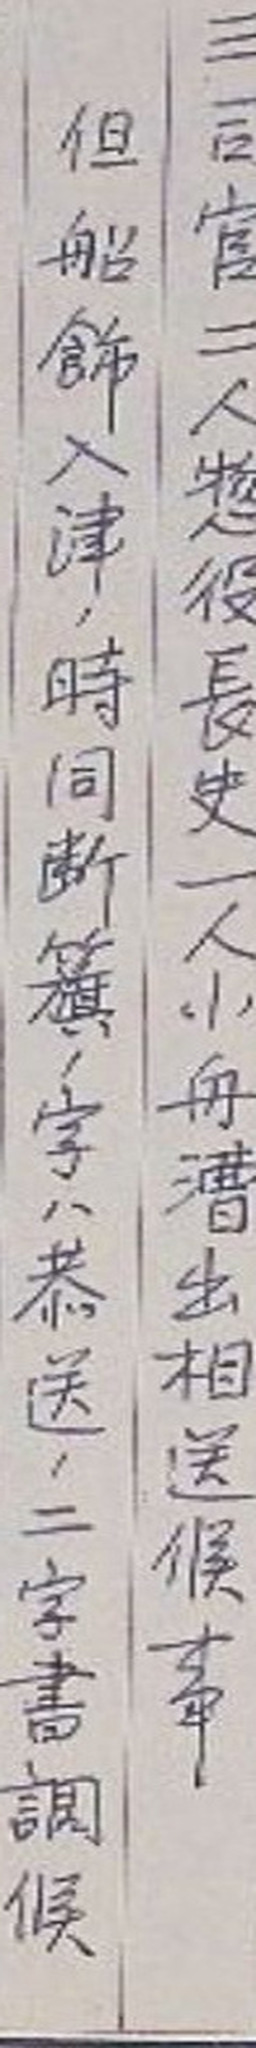但船飾入津の時同断旗の字は恭送の二字書調候
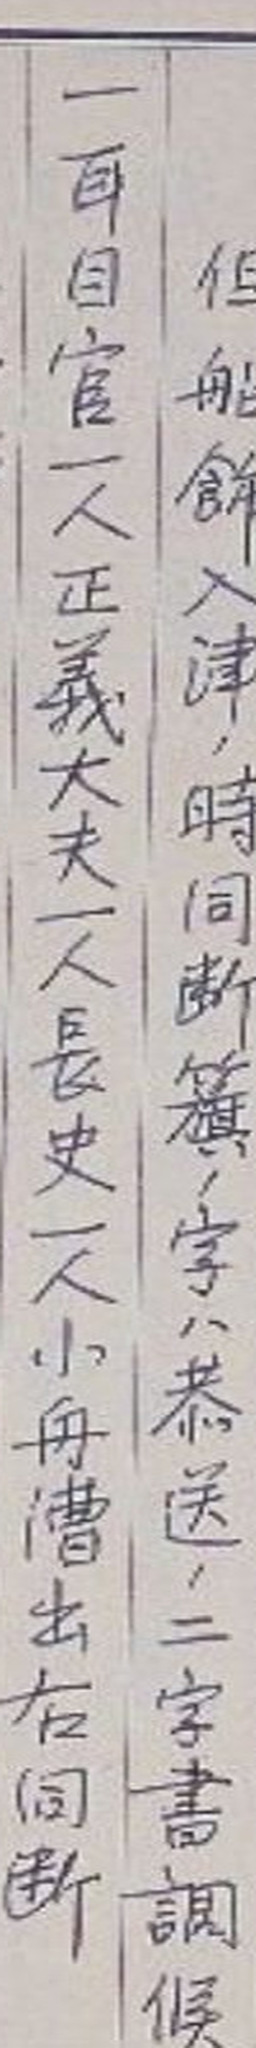一耳目官一人正義大夫一人長史一人小舟漕出右同断
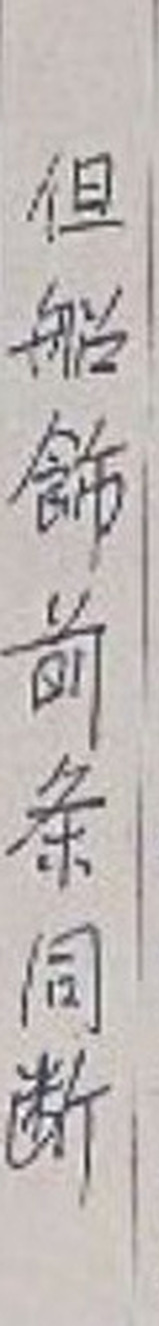但船飾前条同断
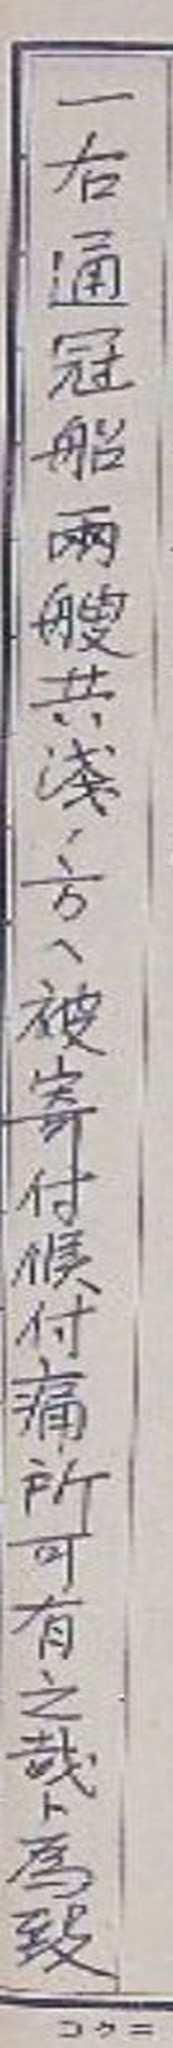一右通冠船両艘共浅の方へ被寄付候付痛所可有之哉と為致
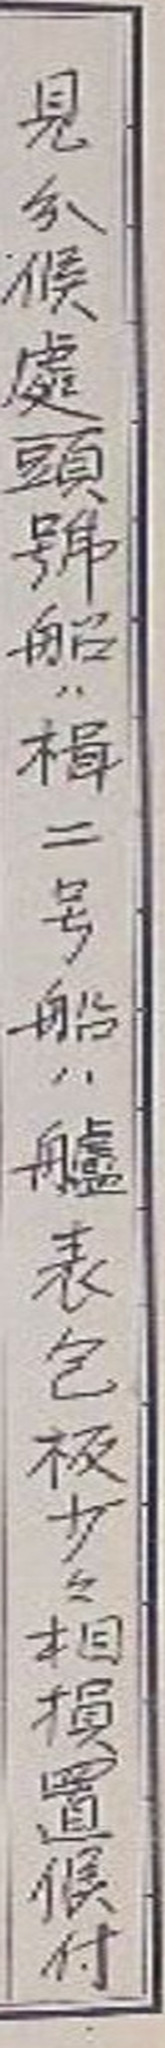見分候処頭号船は楫二号船は艫表包板少々相損置候付
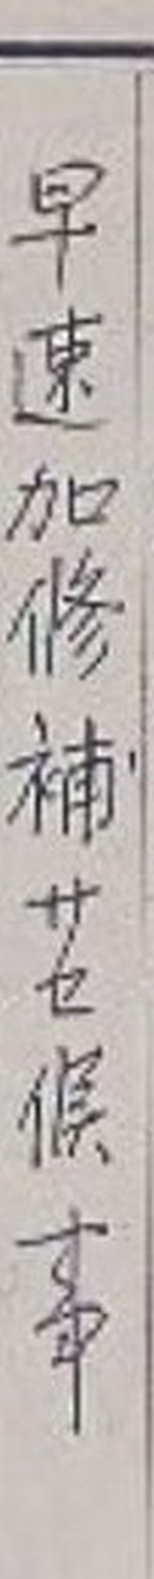早速加修補させ候事
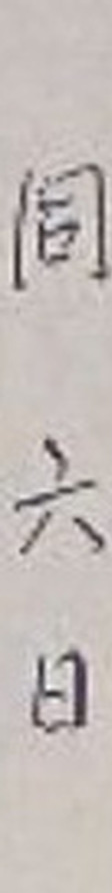同六日
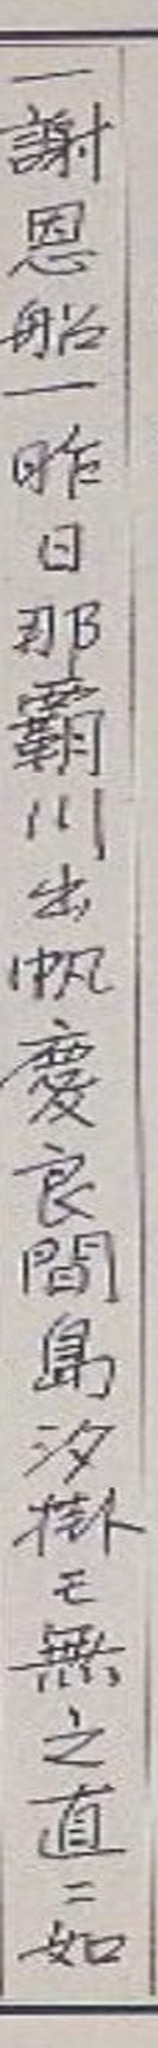一謝恩船一昨日那覇川出帆慶良間島汐掛も無之直に如
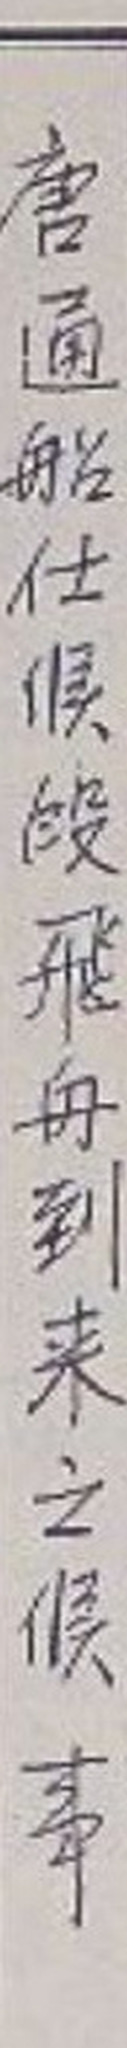唐通船仕候段飛舟到来之候事
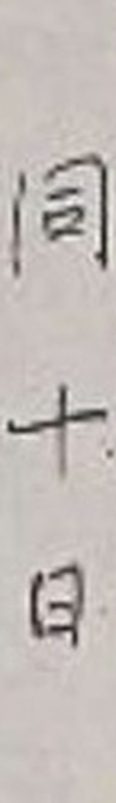同十日
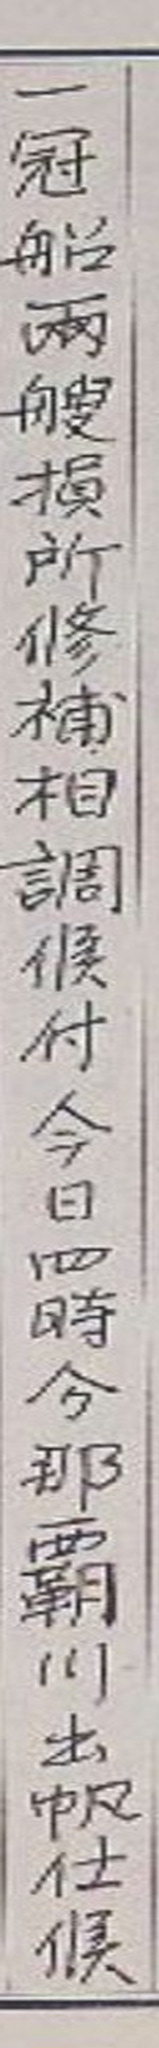一冠船両艘損所修補相調候付今日四時分那覇川出帆仕候
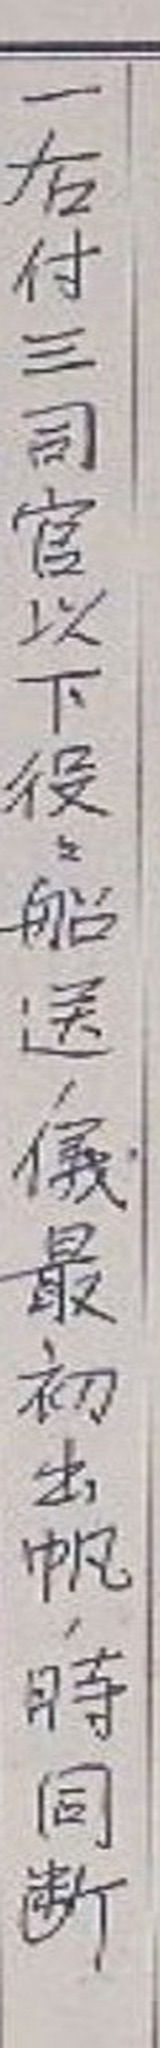一右付三司官以下役々船送の儀最初出帆の時同断
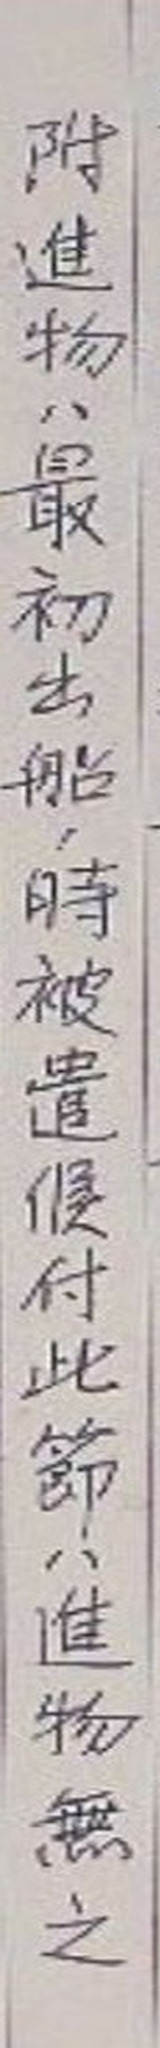附進物は最初出船の時被遣候付此節は進物無之
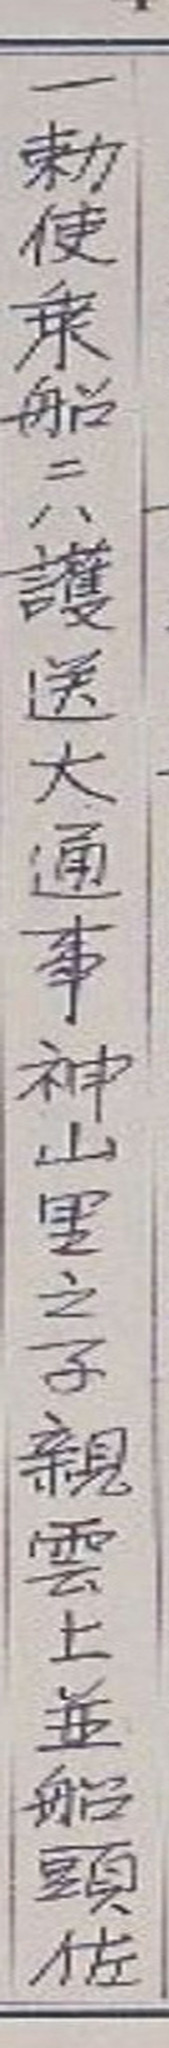一勅使乗船には護送大通事神山里之子親雲上並船頭佐
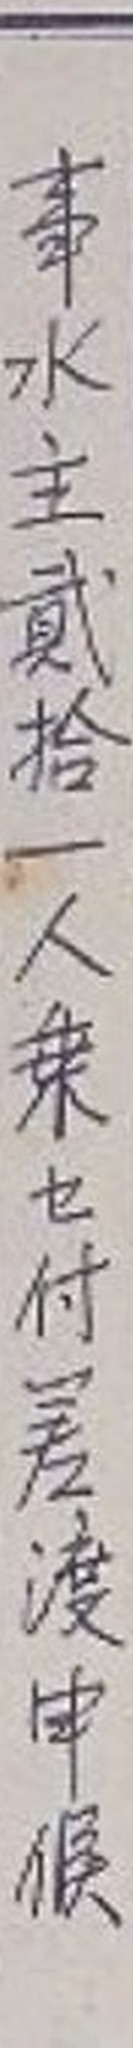事水主弐拾一人乗せ付差渡申候
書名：支那冊封使来琉諸記 下巻
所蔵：University of the Ryukyus Library
